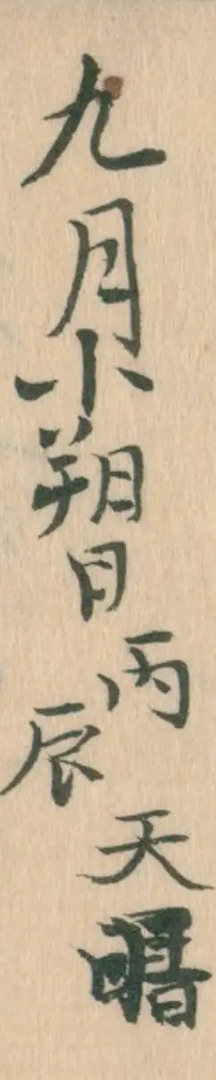九月小朔日丙辰天晴

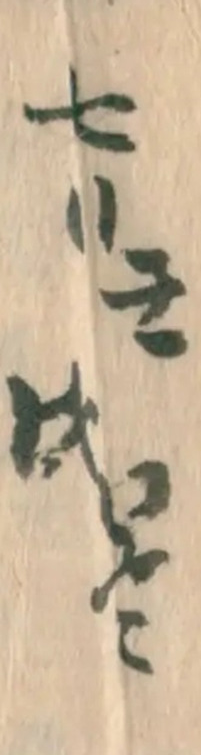七日壬戌曇
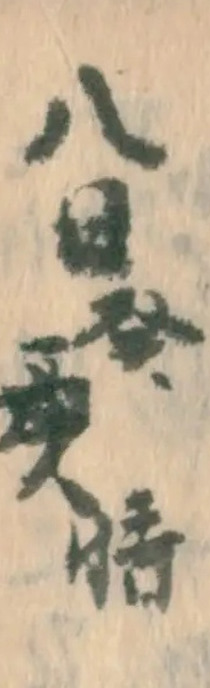八日癸亥晴
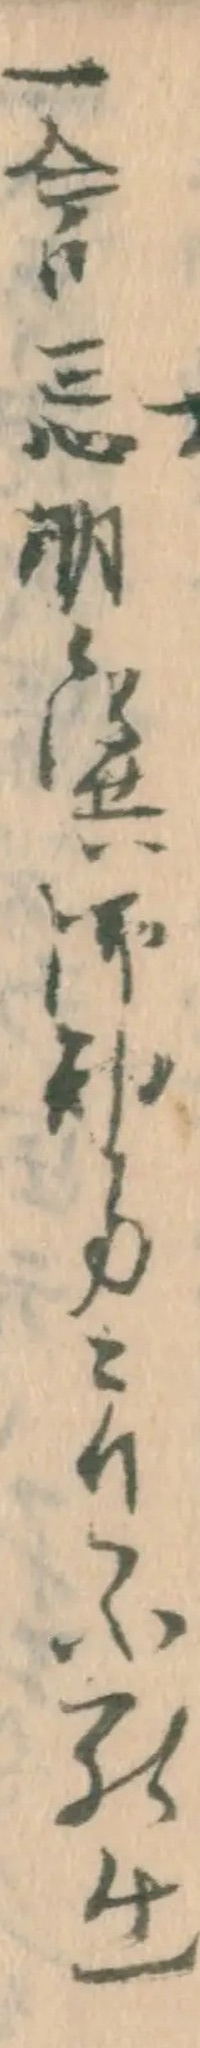一今日忌明候得共御神事ニ付不罷出
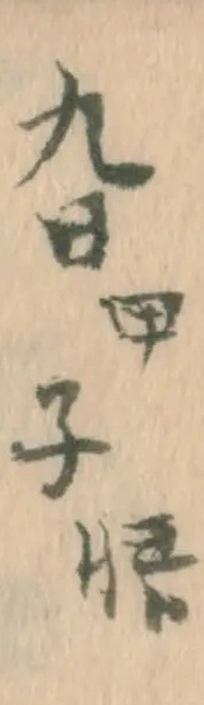九日甲子晴
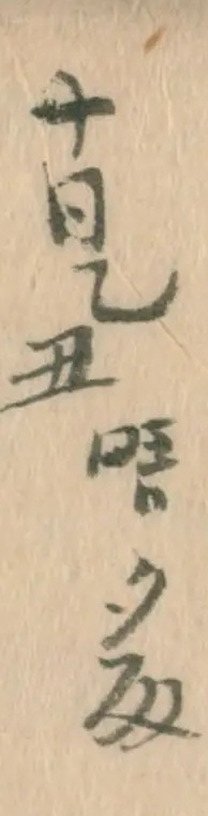十日乙丑晴夕雨
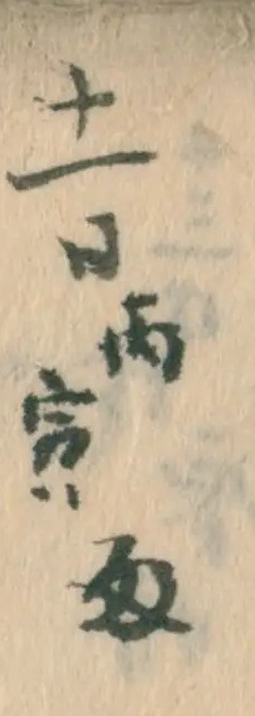十一日丙寅雨

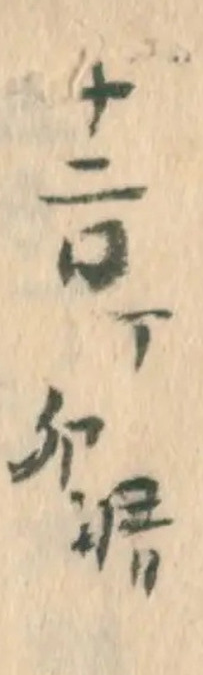十二日丁卯晴
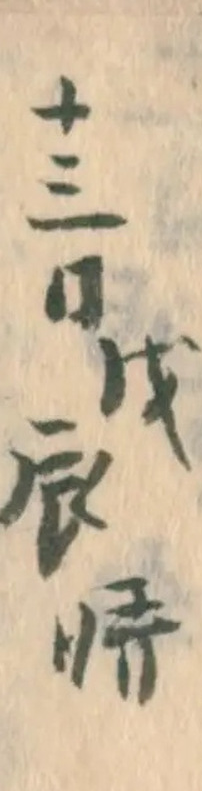十三日戊辰晴
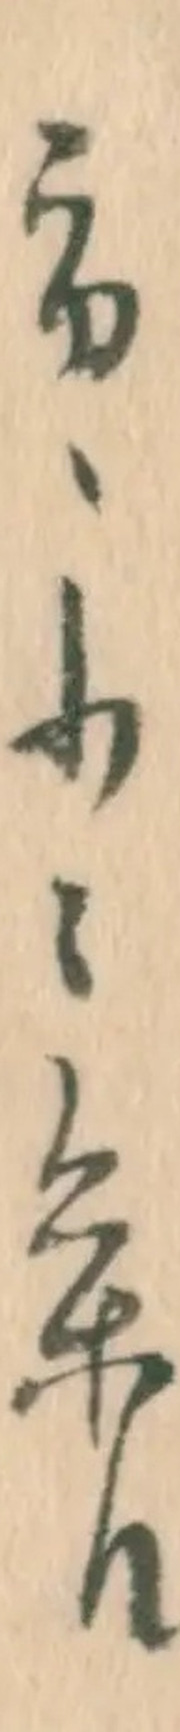方へ少々参ル
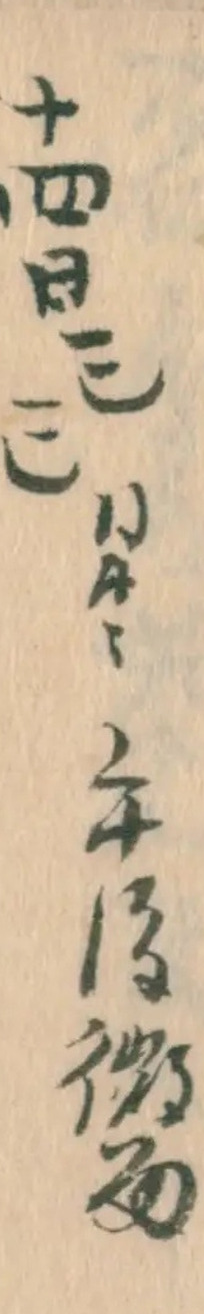十四日己巳曇午後微雨
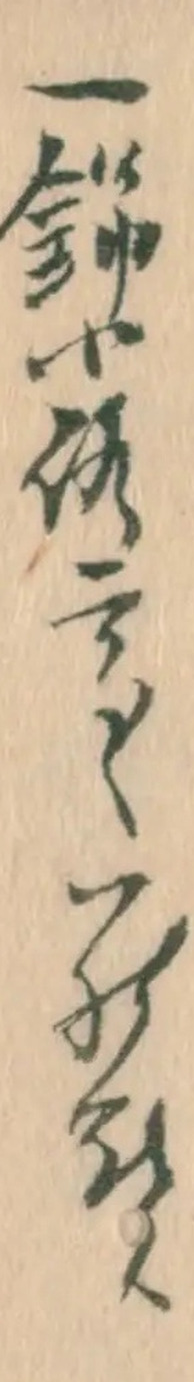一錦小路亭へ罷越ス
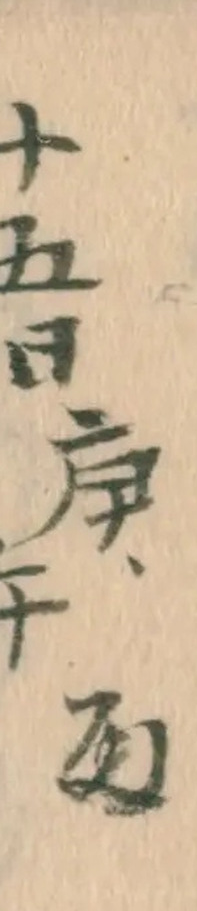十五日庚午雨
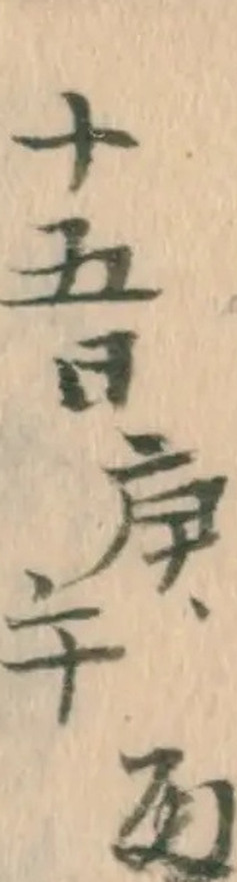十五日庚午雨
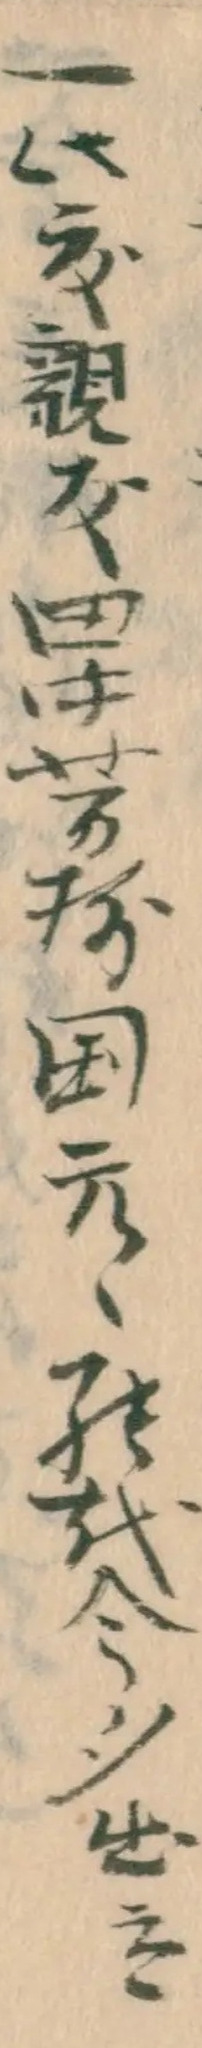一此度親友田中芳揃国元へ罷越今夕出立
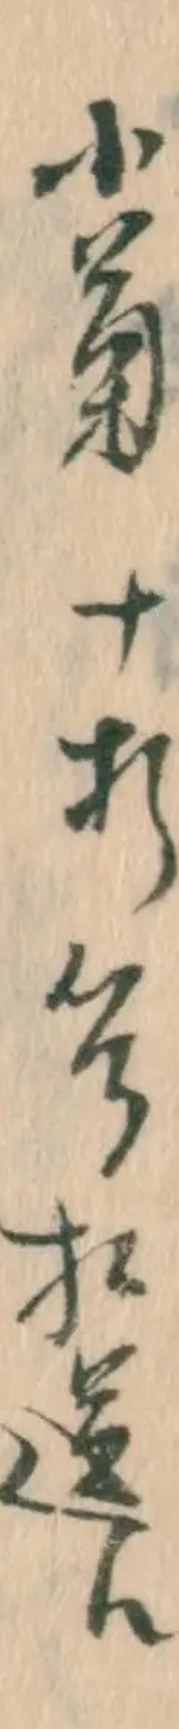小菊十折等相送ル
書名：禁裏御所御用日記. [131]
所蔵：国立国会図書館 National Diet Library, JAPAN
